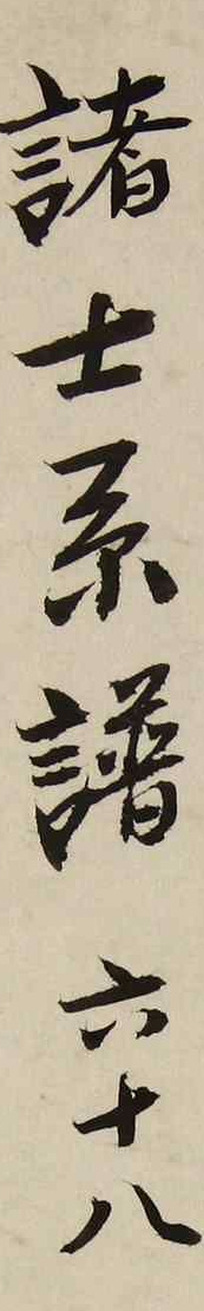諸士系譜六十八

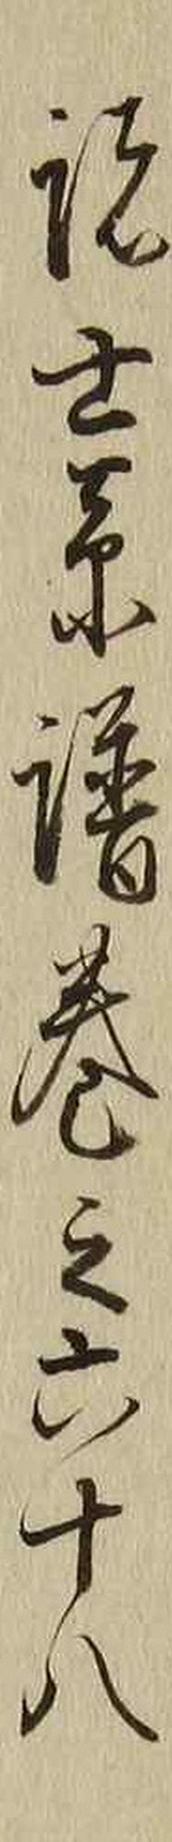諸士系譜巻之六十八
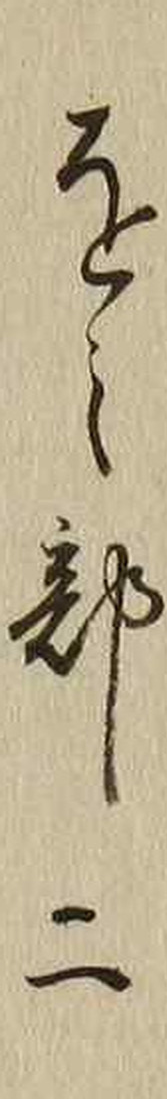を之部二
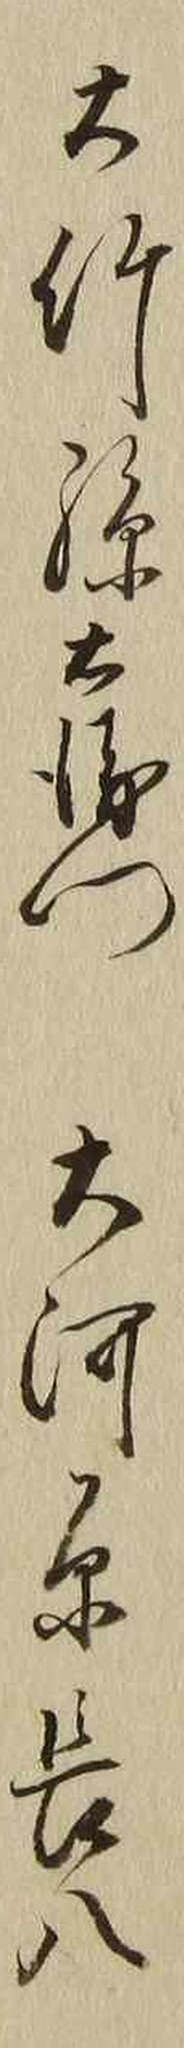大竹孫右衛門大河原長八

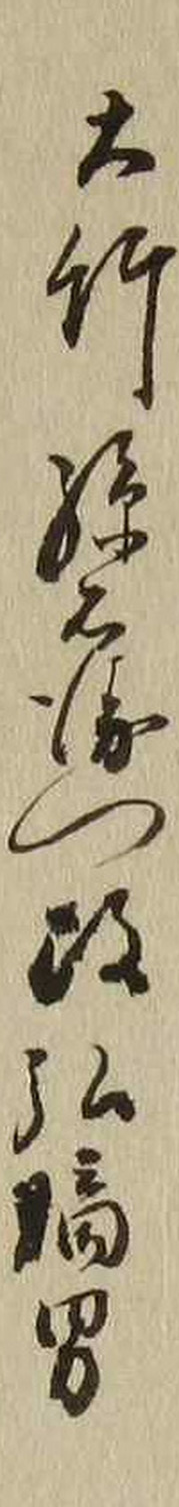大竹孫右衛門政弘嫡男
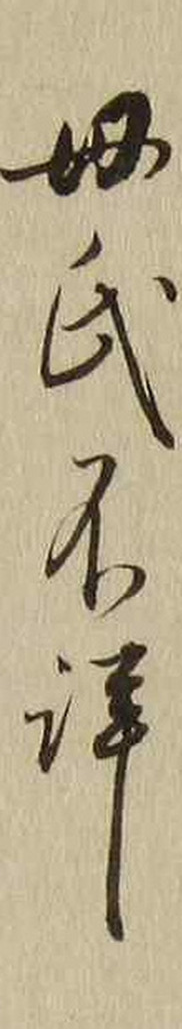母氏不詳
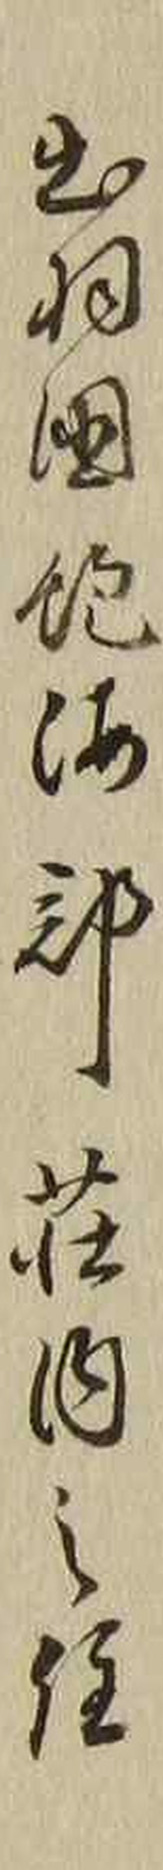出羽国蚫海部荘内之住

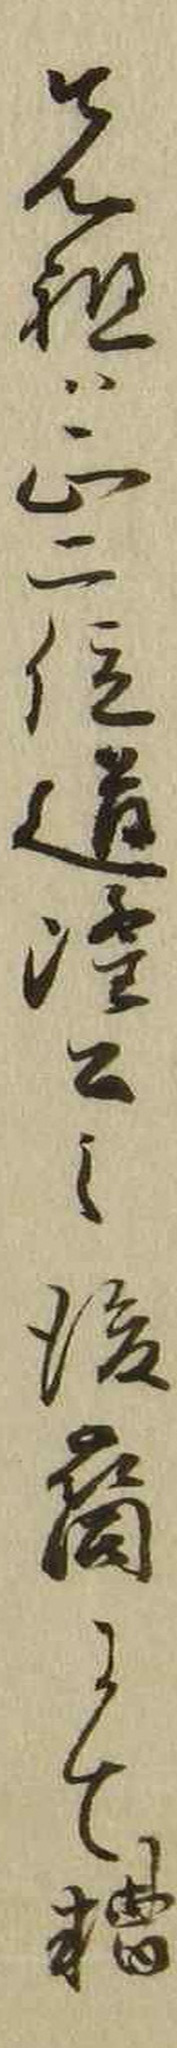先祖ハ正二位道隆公之後裔にて糟
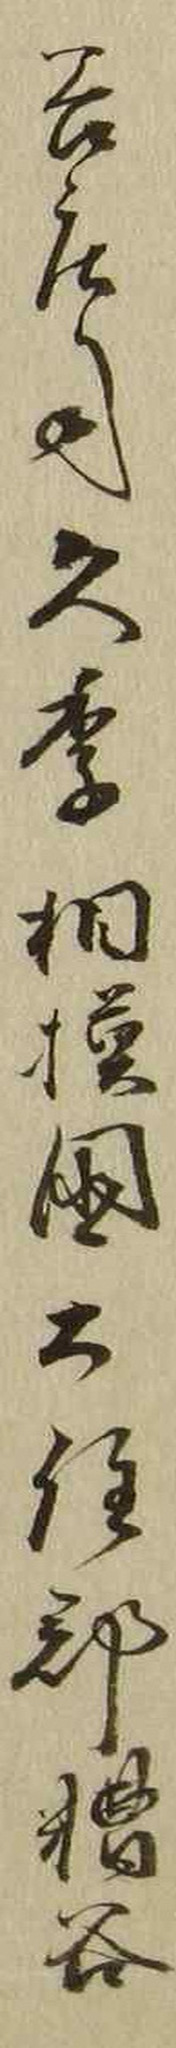谷庄司久季相模国大住郡糟谷
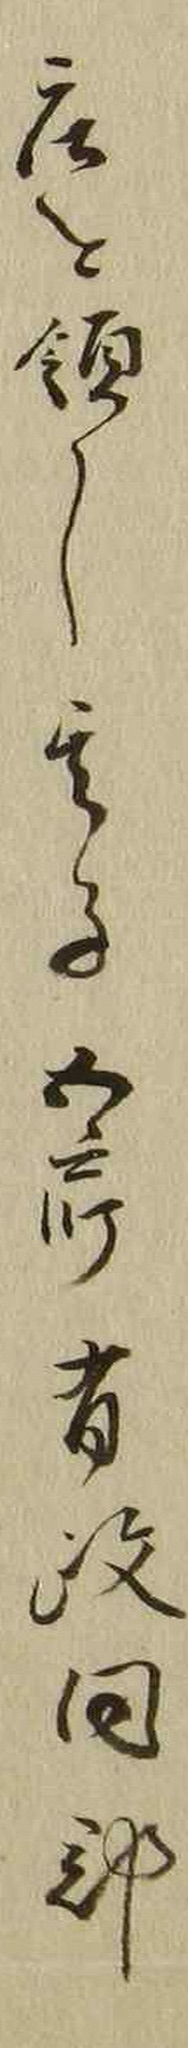庄を領し其子五郎有政同郡
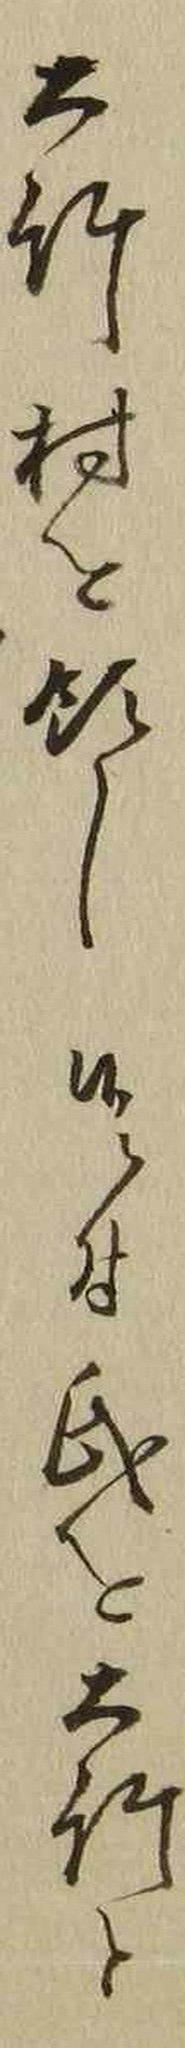大竹村を領し候ニ付氏を大竹と
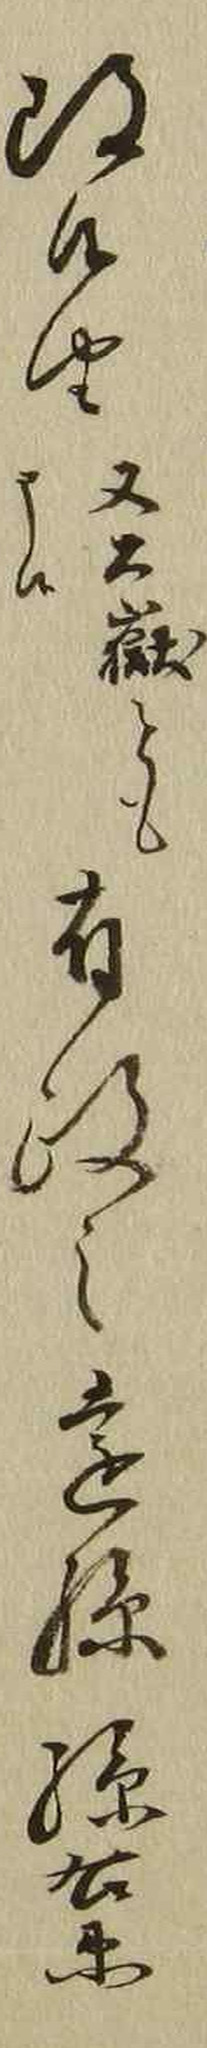改候由又大嶽とも申候有政之遠孫孫右衛
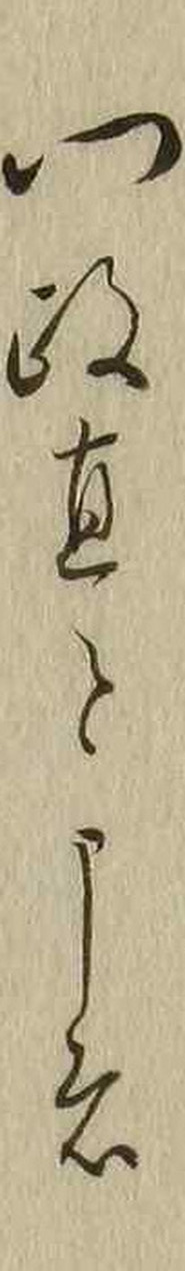門政直と申者
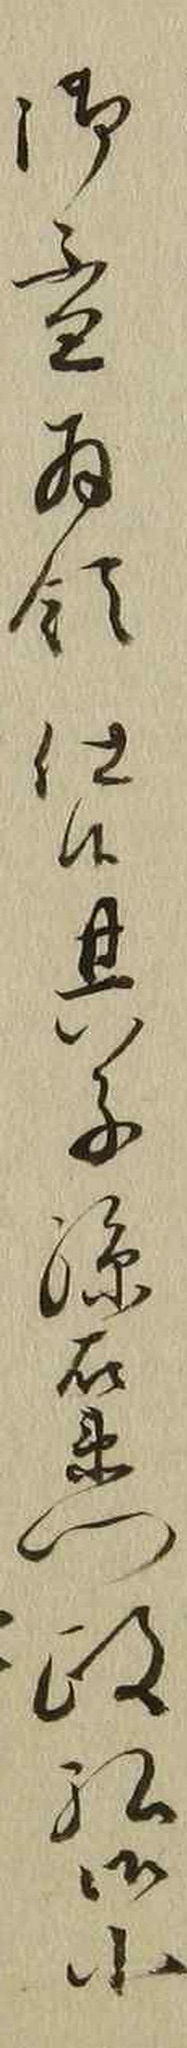御盃拝領仕候其子孫右衛門政弘御小
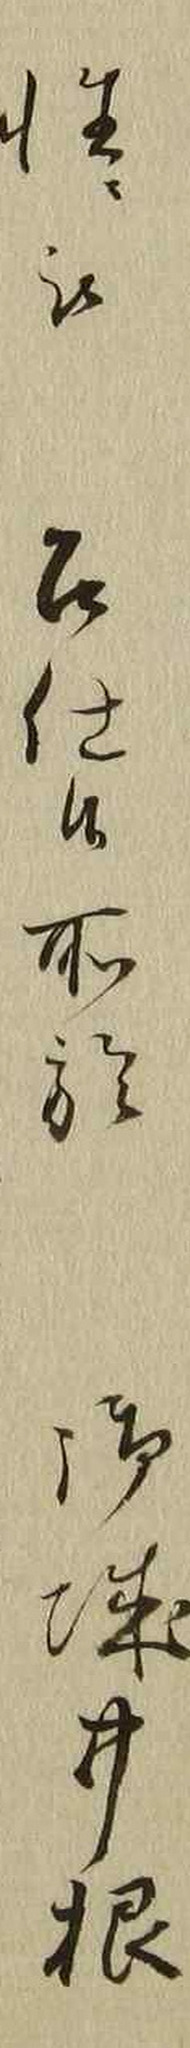性ニ被召仕候所於御城中根
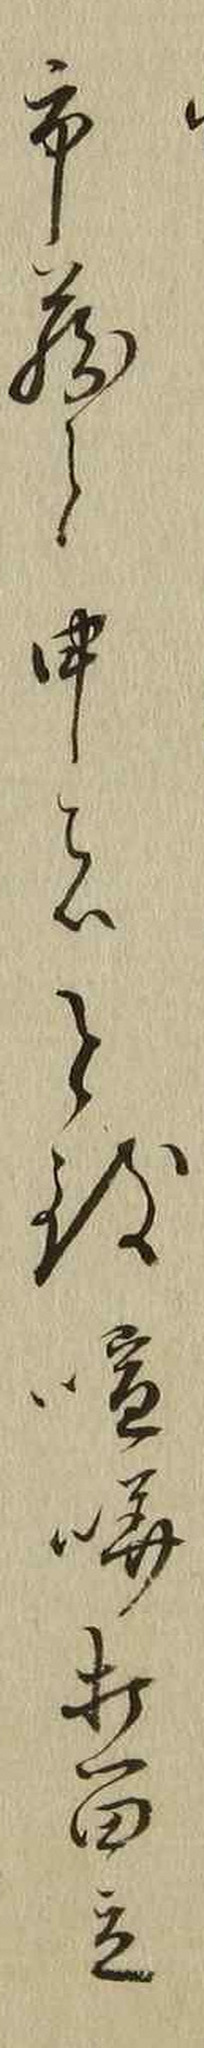市蔵と申者と致喧嘩打留立
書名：諸士系譜　巻之68　を之部2
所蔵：会津若松市立会津図書館
